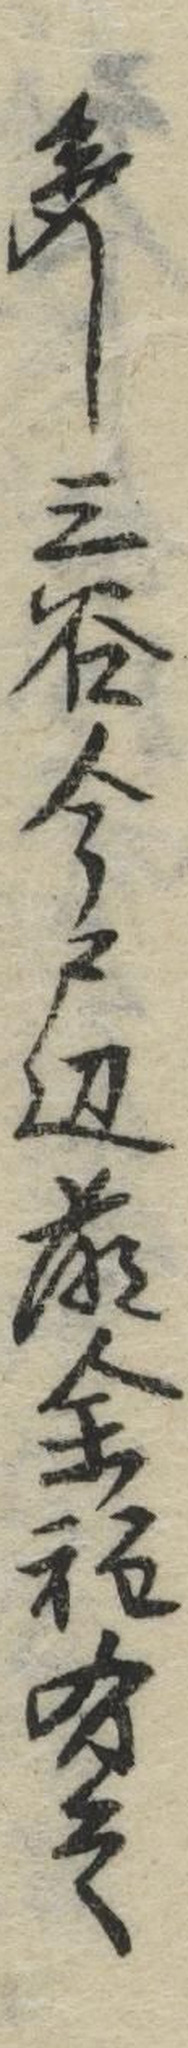多し三谷今戸辺崩余程有之
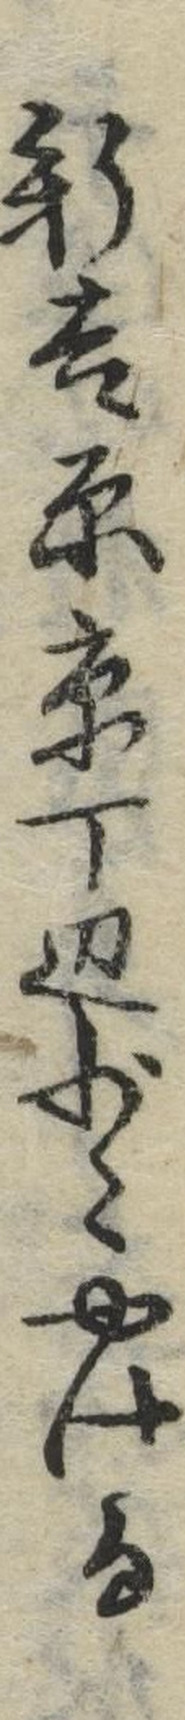新吉原京丁辺少〻やける
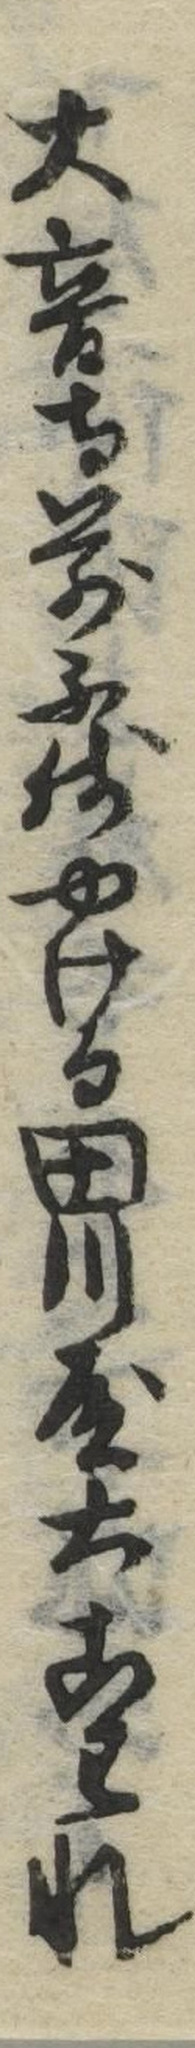大音寺前不残やける田川屋大こわれ

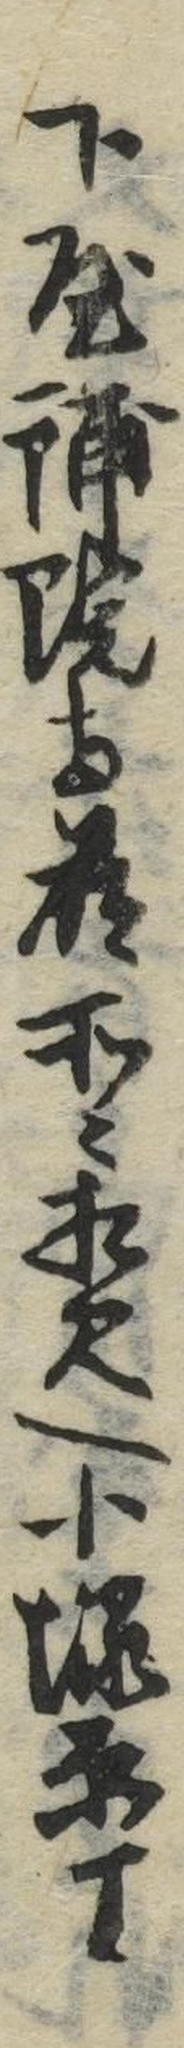下屋舗院寺崩所々相見へ小堀東丁
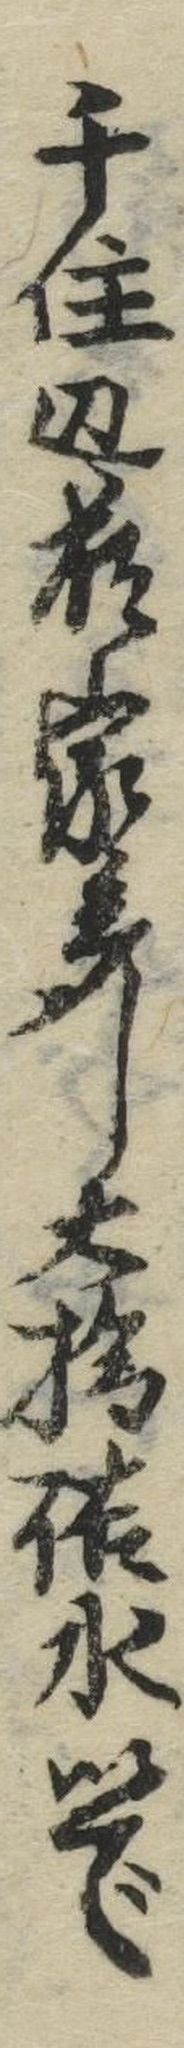千住辺崩家多し大橋詰水いで
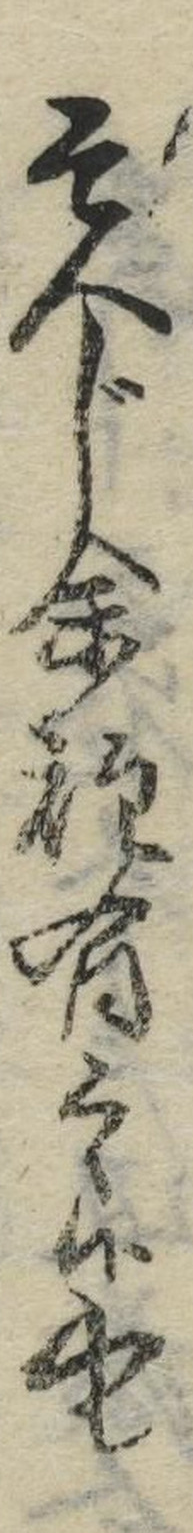そんじ余程有之候由
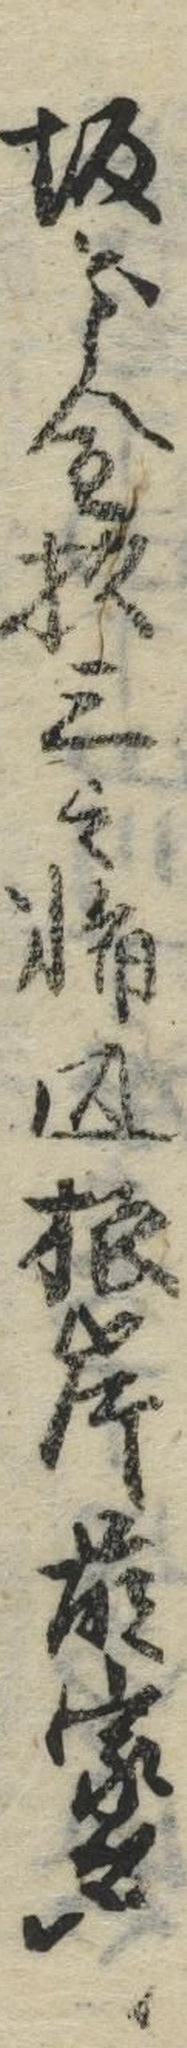坂下金杉三兵衛辺根岸崩家多
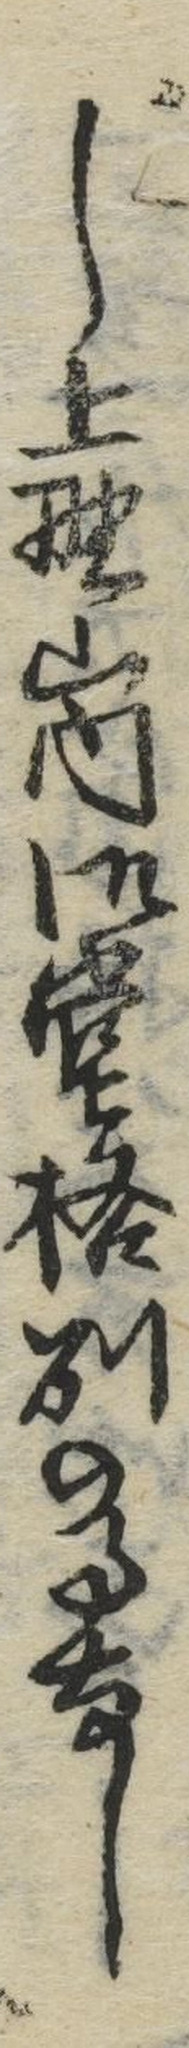し上野山門御堂格別の事なし
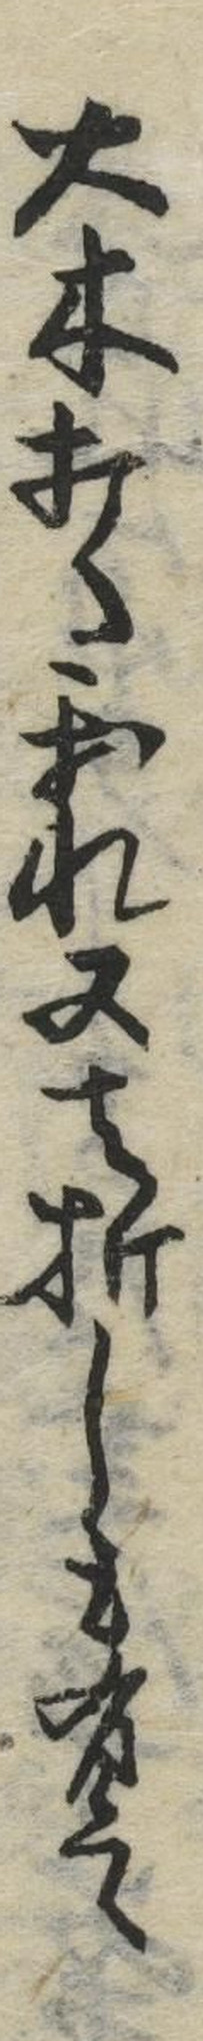大木打たおれ又は折しも有之
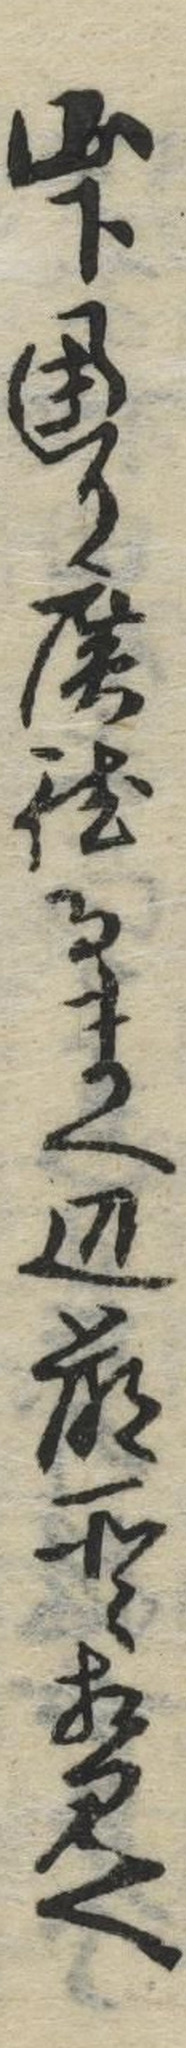山下通り広徳寺まへ辺崩所々相見へ
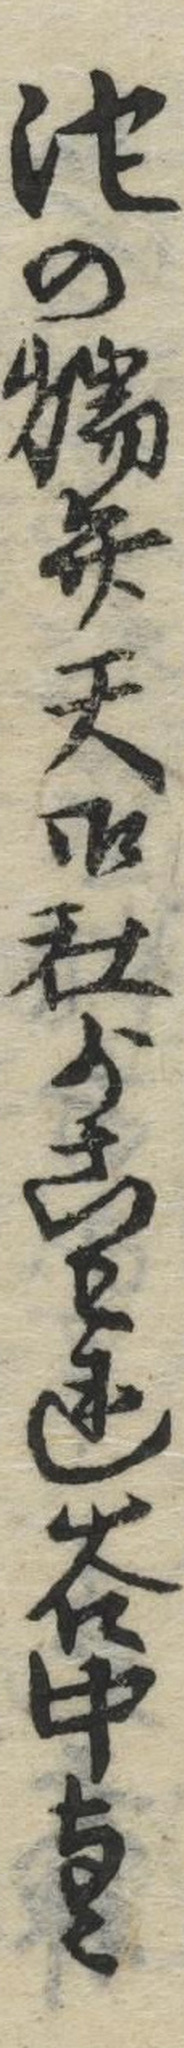池の端弁天御社少こわれ谷中寺
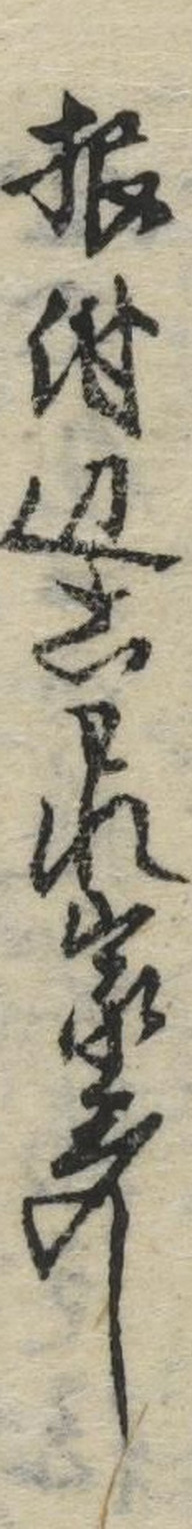根附辺こわれ家多し
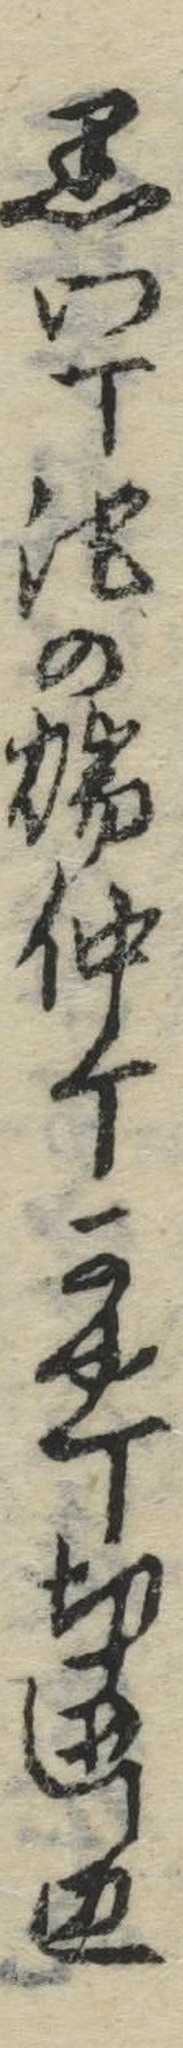黒門丁池の端仲ノ町かや丁切通の辺
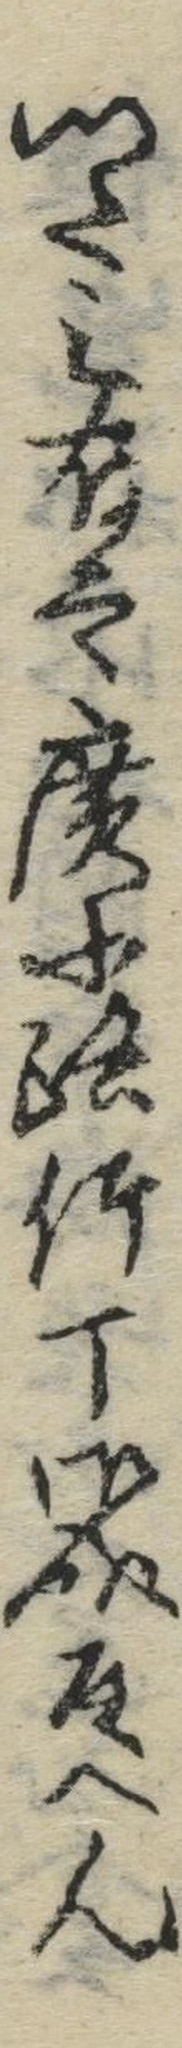いたみ有之広小路竹丁御成屋へん
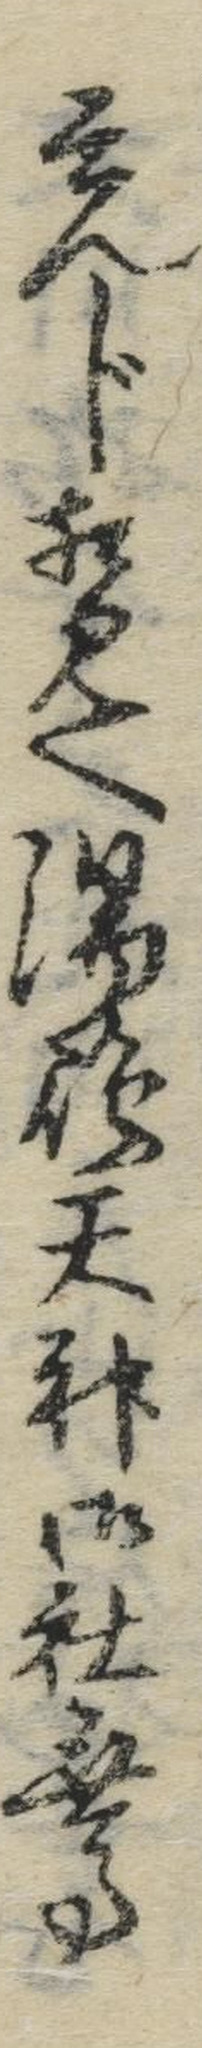そんじ相見へ湯嶋天神御社無事
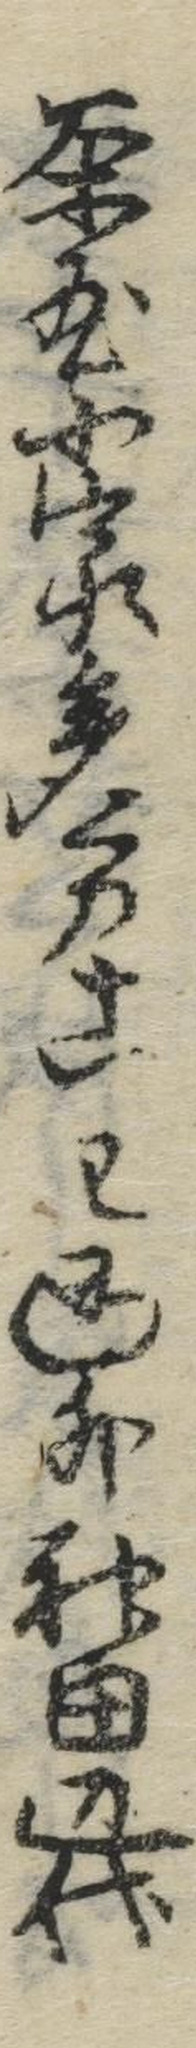茶屋小家多分こわれ外神田辺代
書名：安政三年辰八月廿五日夜　大江都御屋敷方寺社市中共　大嵐水入場所明細書之寫　并街道筋近郷聞書
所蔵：東京大学地震研究所図書室 Earthquake Research Institute Library, The University of Tokyo, JAPAN
